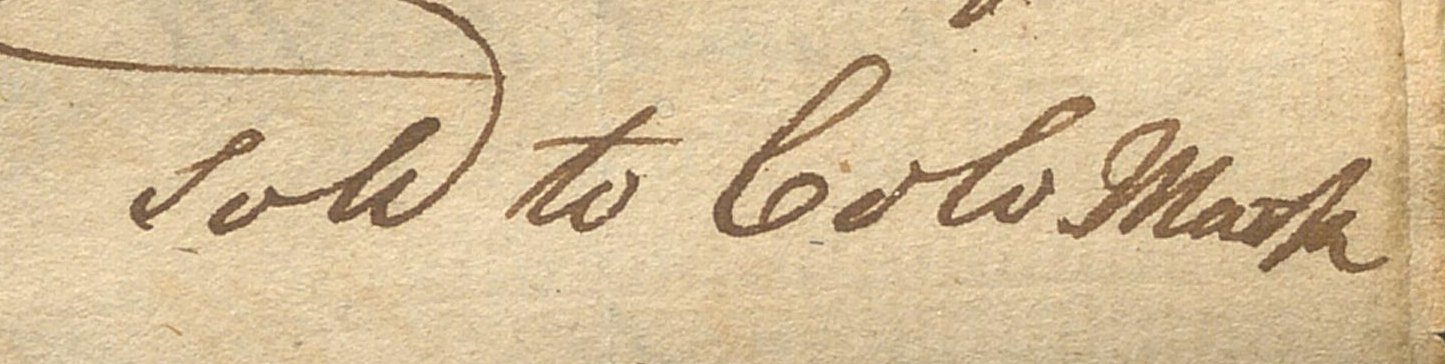sold to Colo. Mark
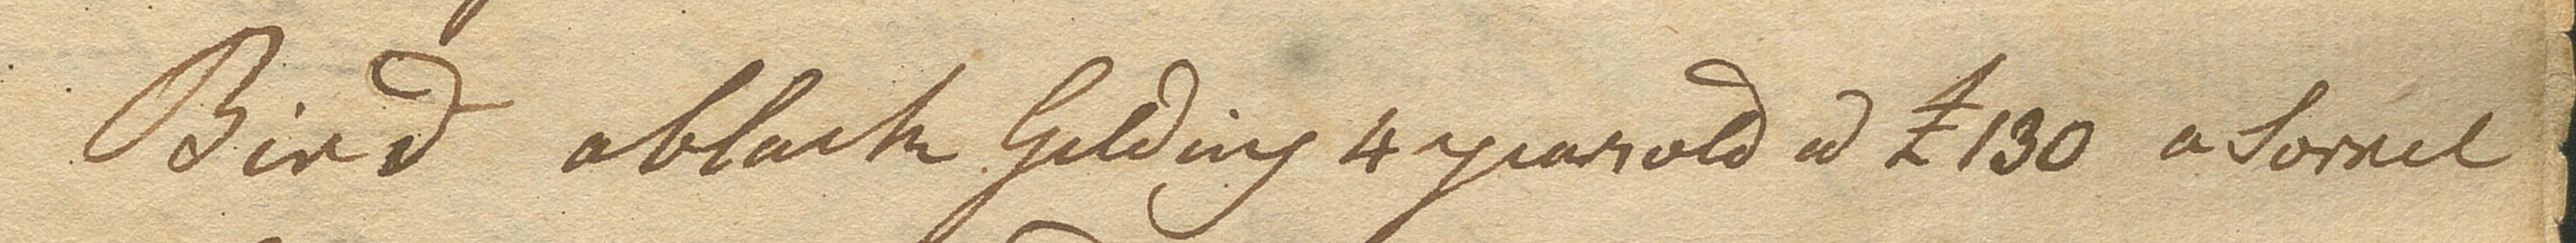Bird a black Gelding 4 years old @ £130 a Sorrel
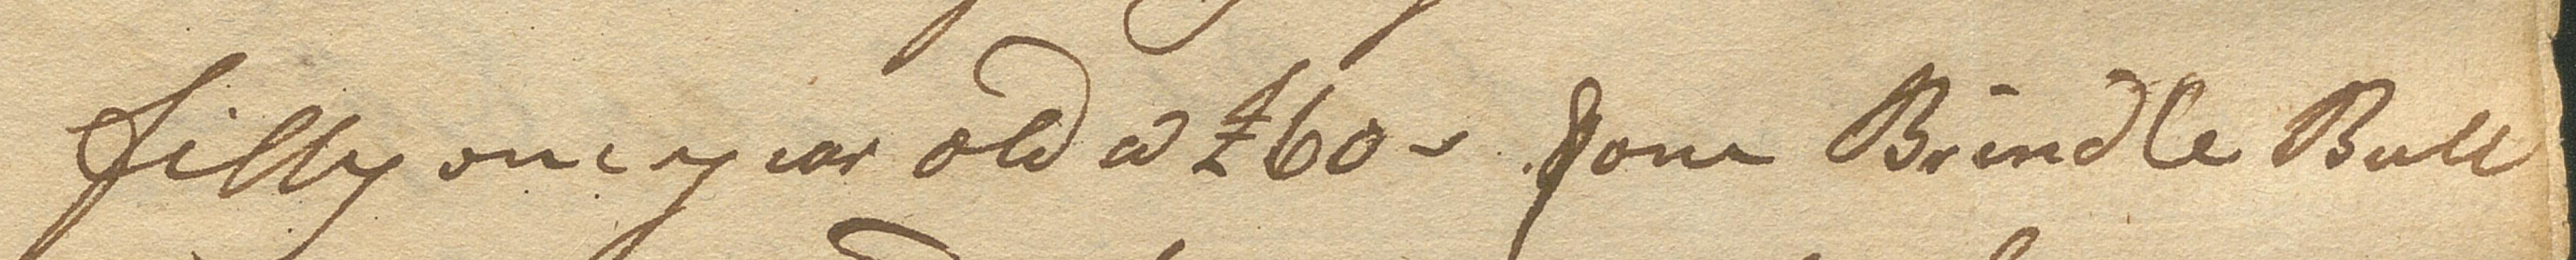filly one year old @ £60 & one Brindle Bull
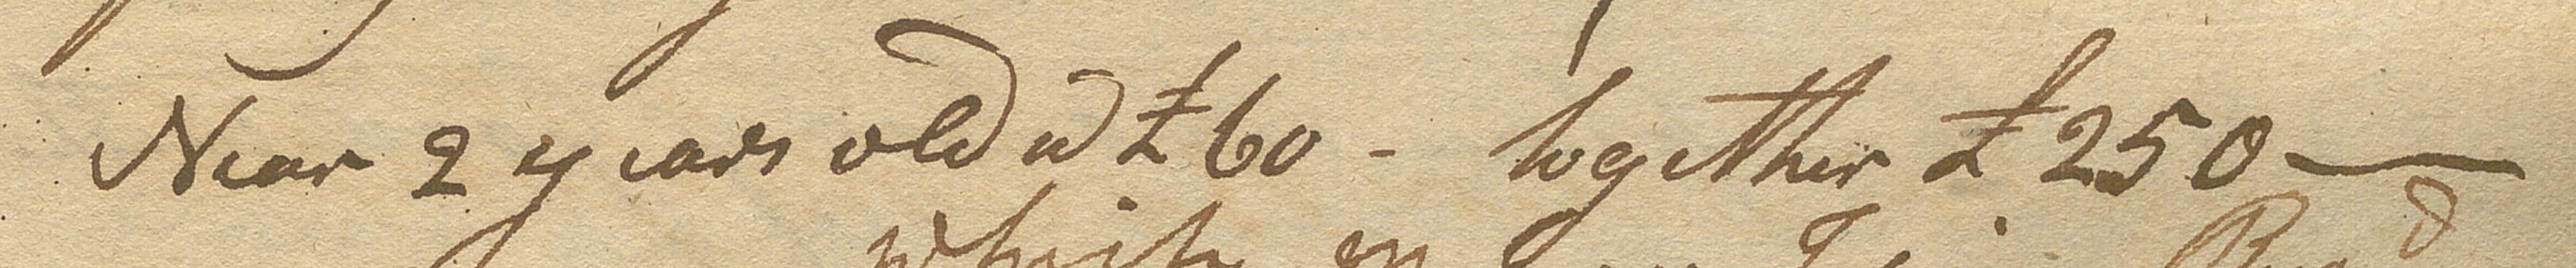Near 2 years old @ £60- together £250-
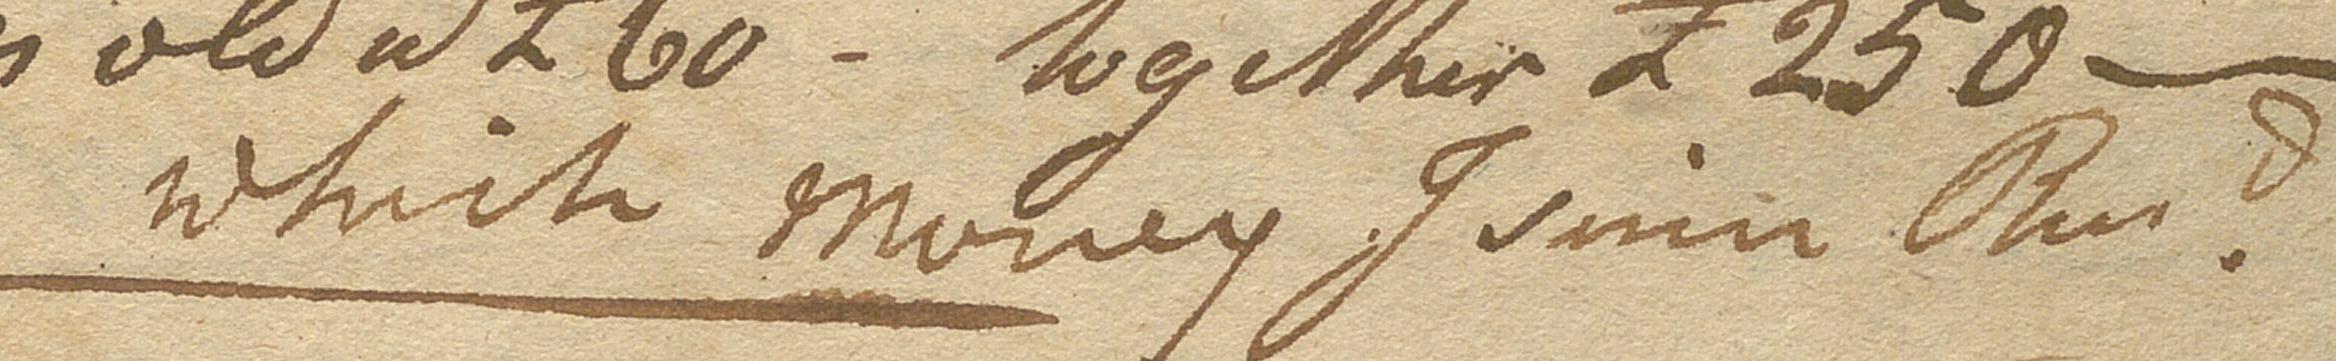which money I since Rec^d.
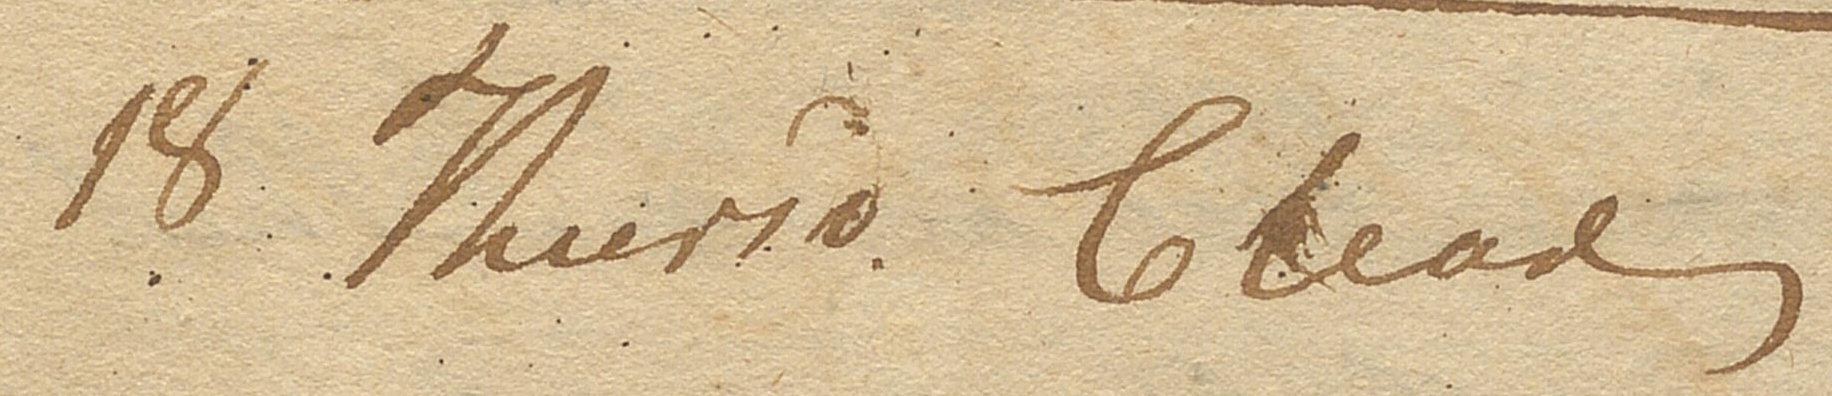18 Thurs. Clear
